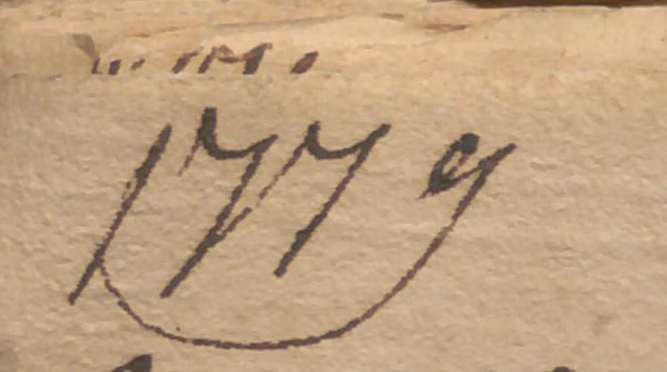1779
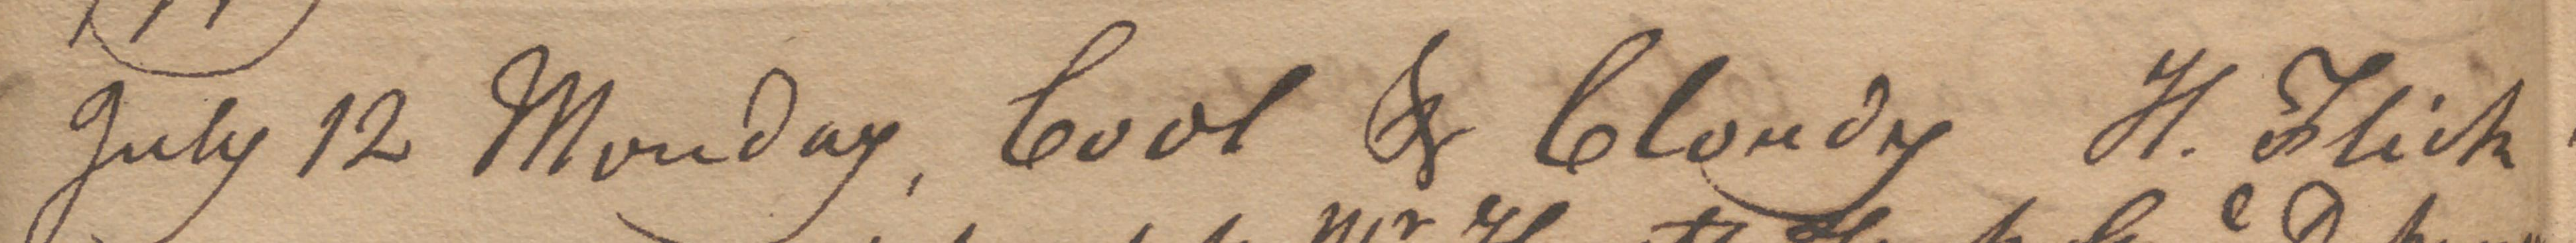July 12 Monday, Cool & Cloudy H. Flick
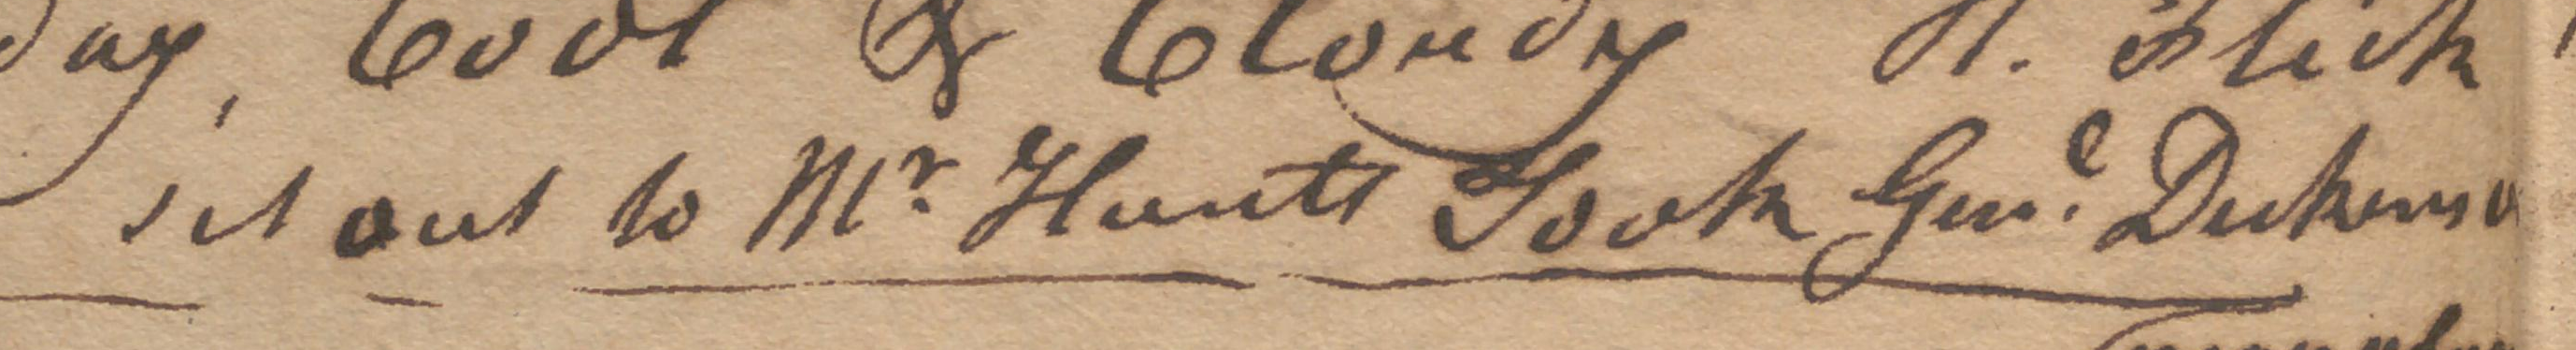set out to M^r Hunts Took Gen^l. Dukens
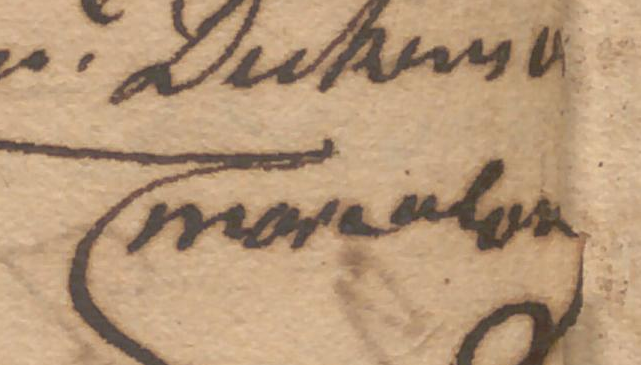mareudow
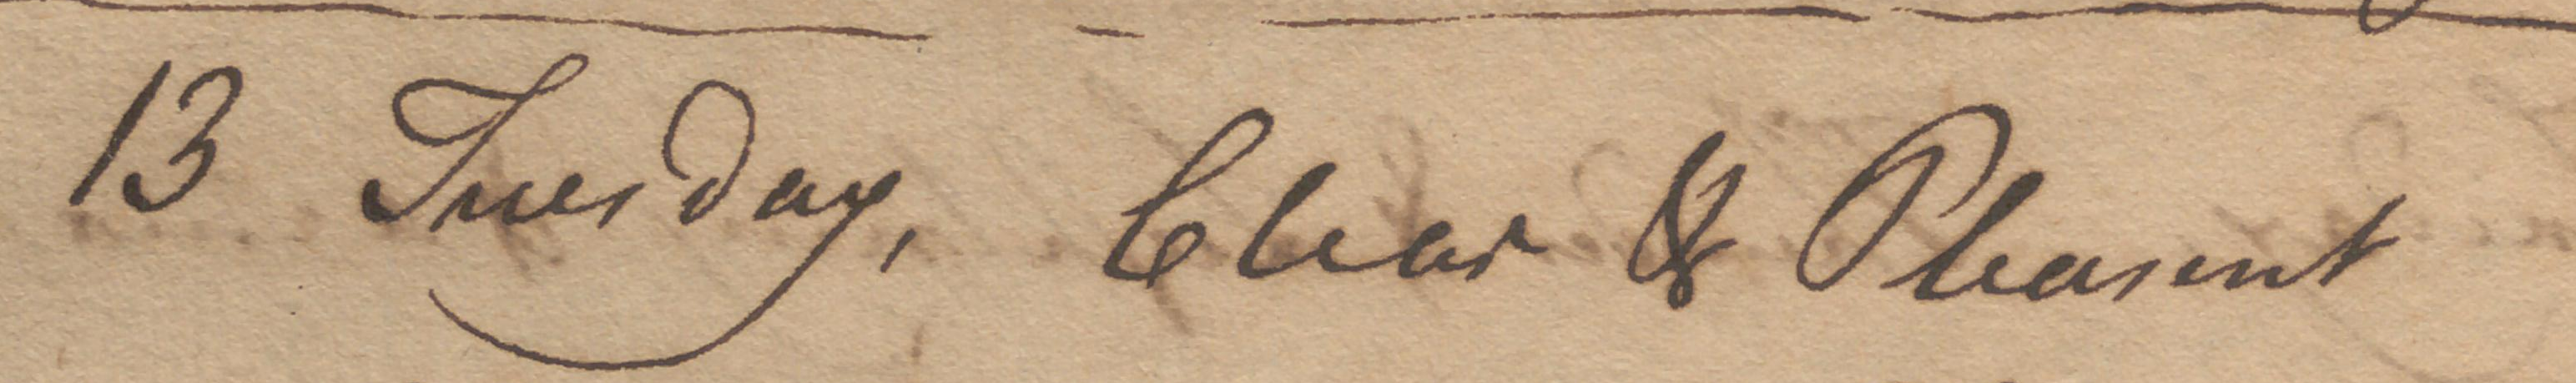13 Tuesday, Clear & Pleasent
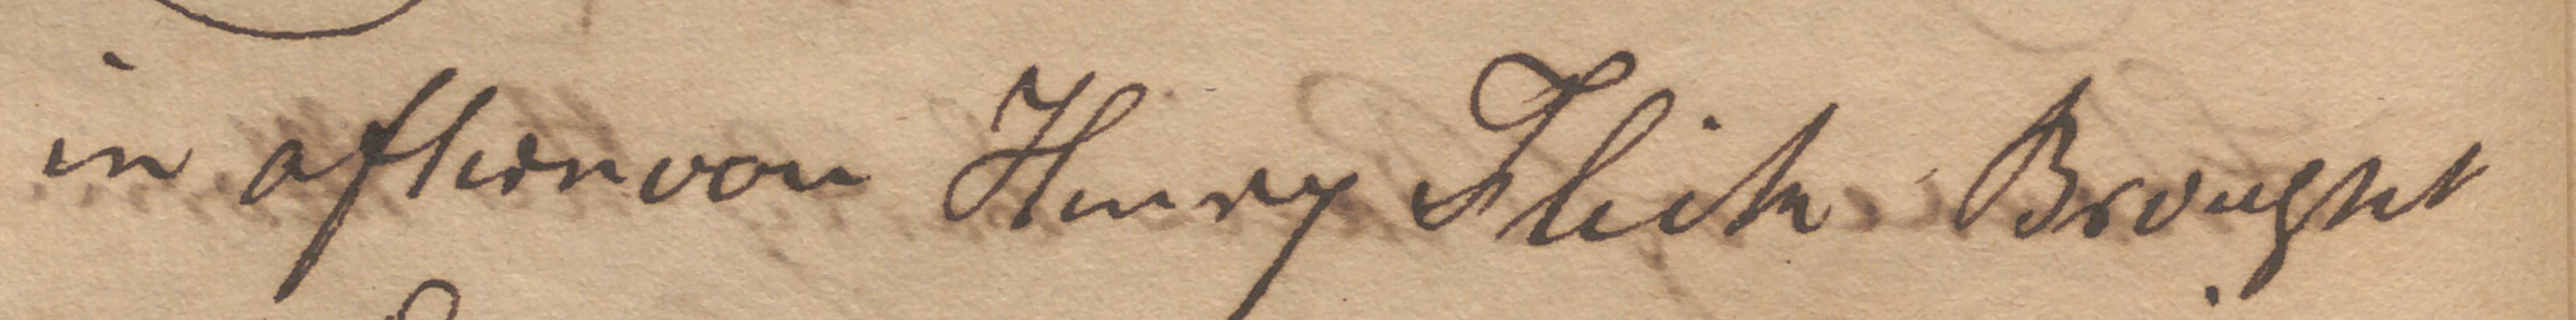in afternoon Henry Flick Brought
